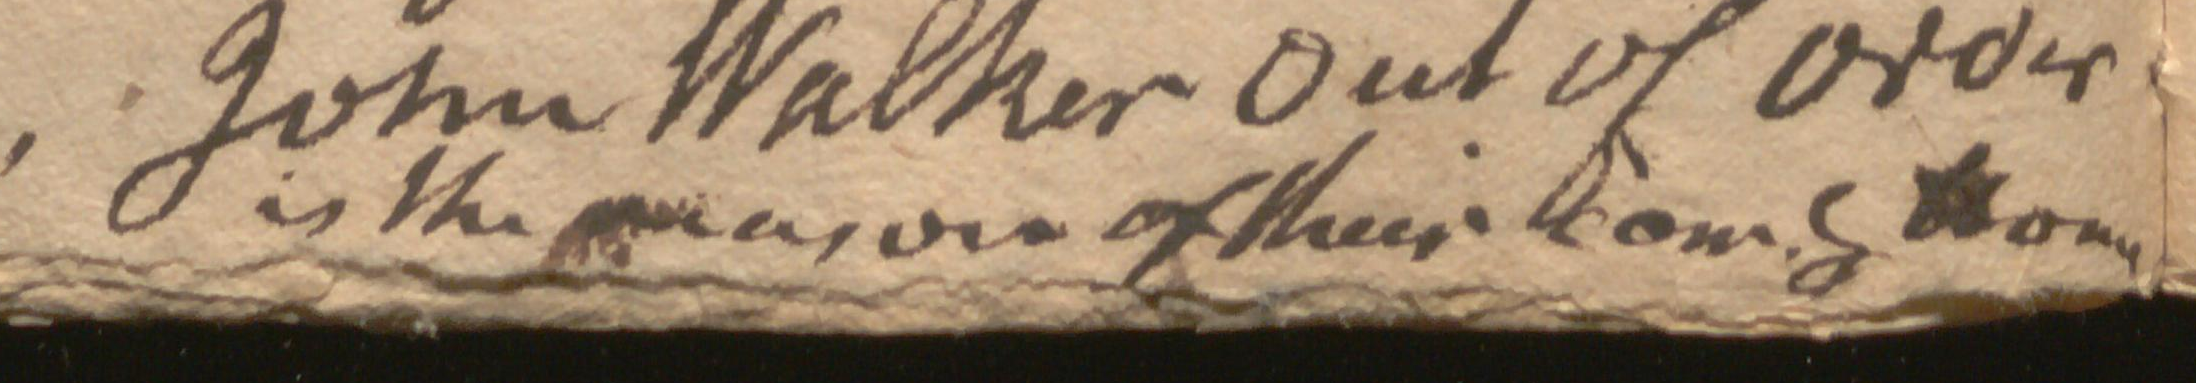is the reason of their com^g. Home
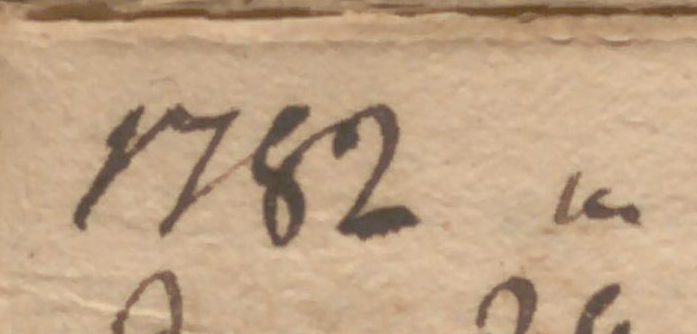1782
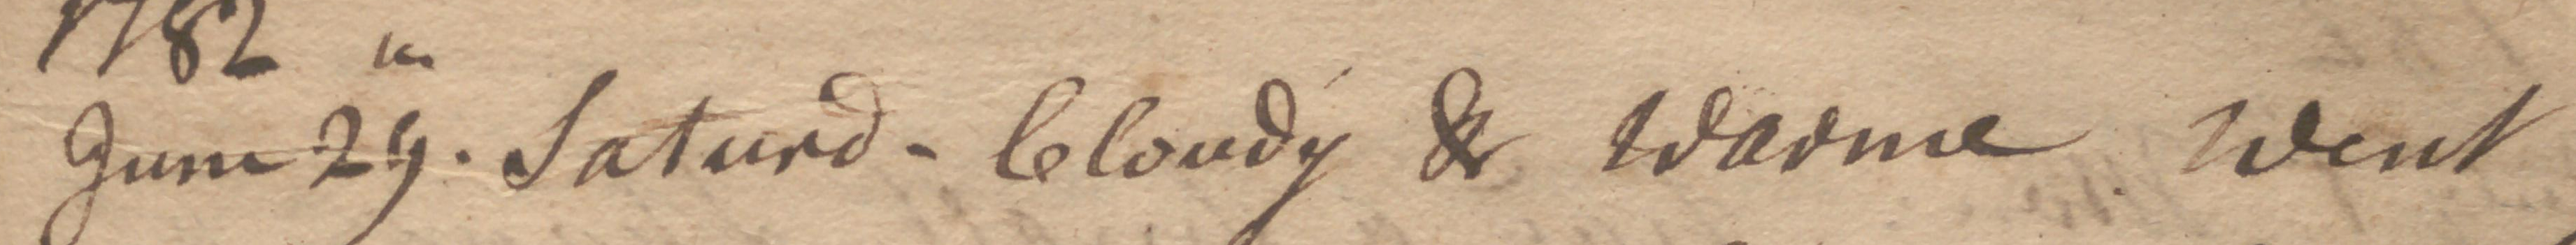June 29^th. Saturd. Cloudy & Warme went
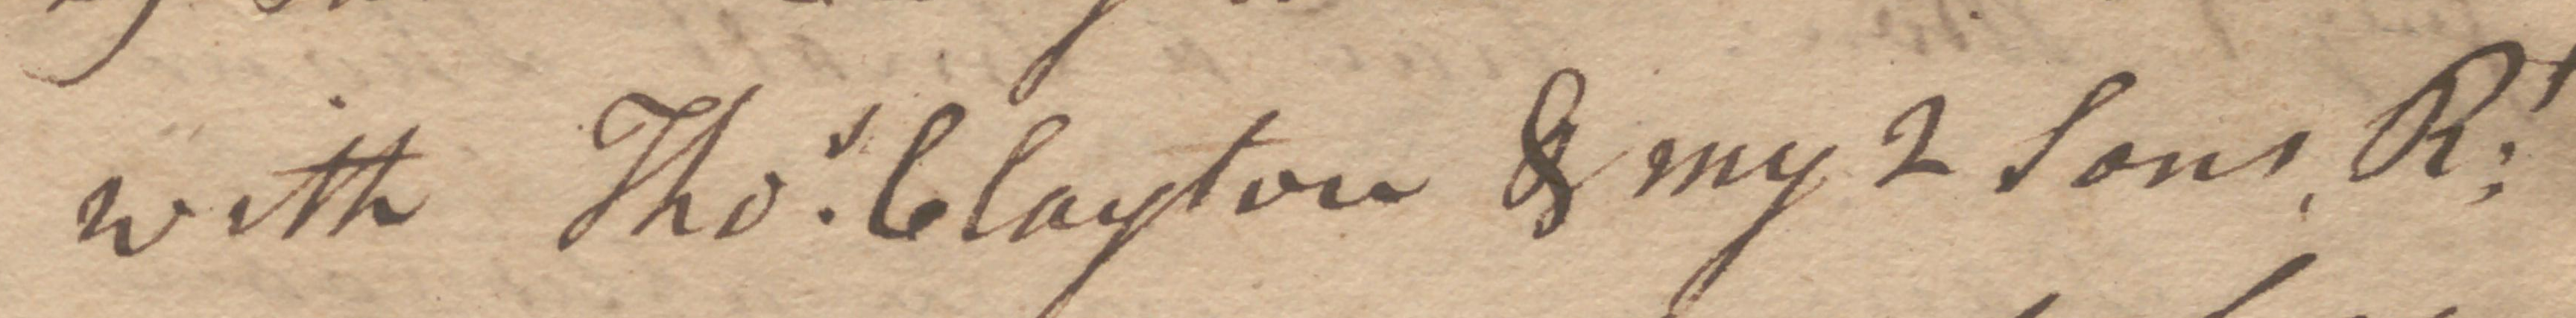with Tho^s. Clayton & my 2 Sons R^t:
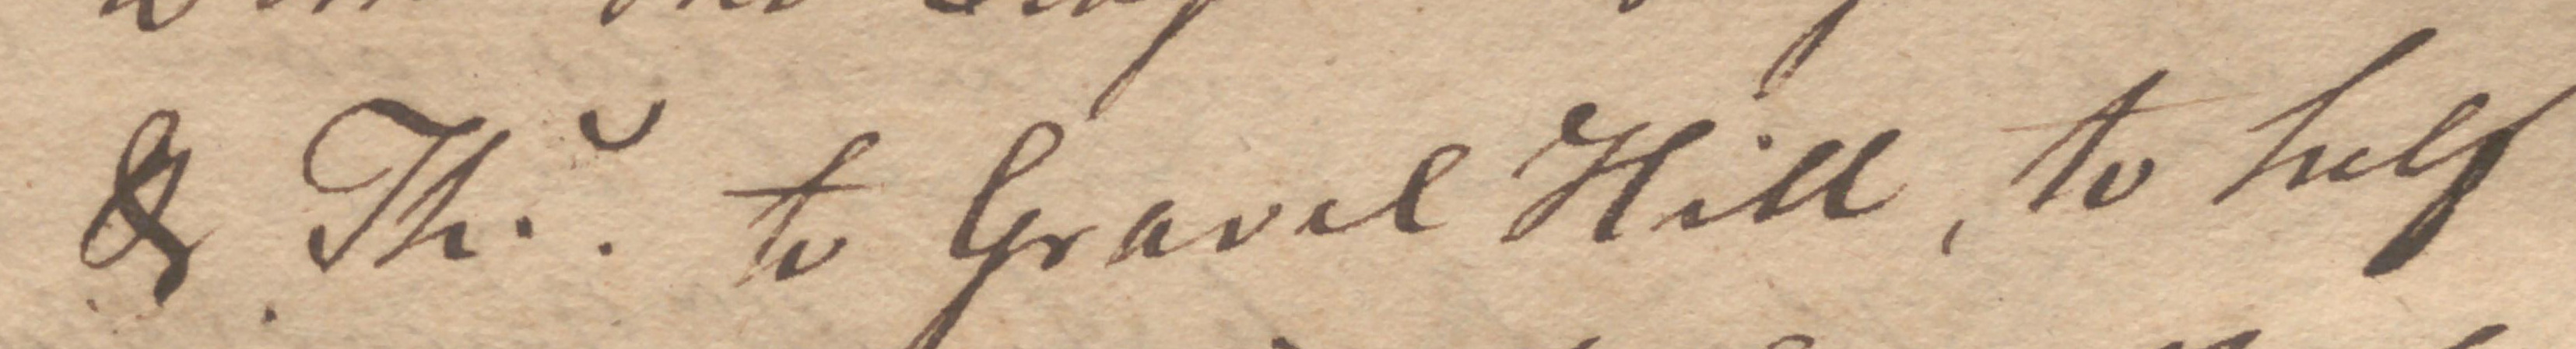& Th^s. to Gravel Hill to help
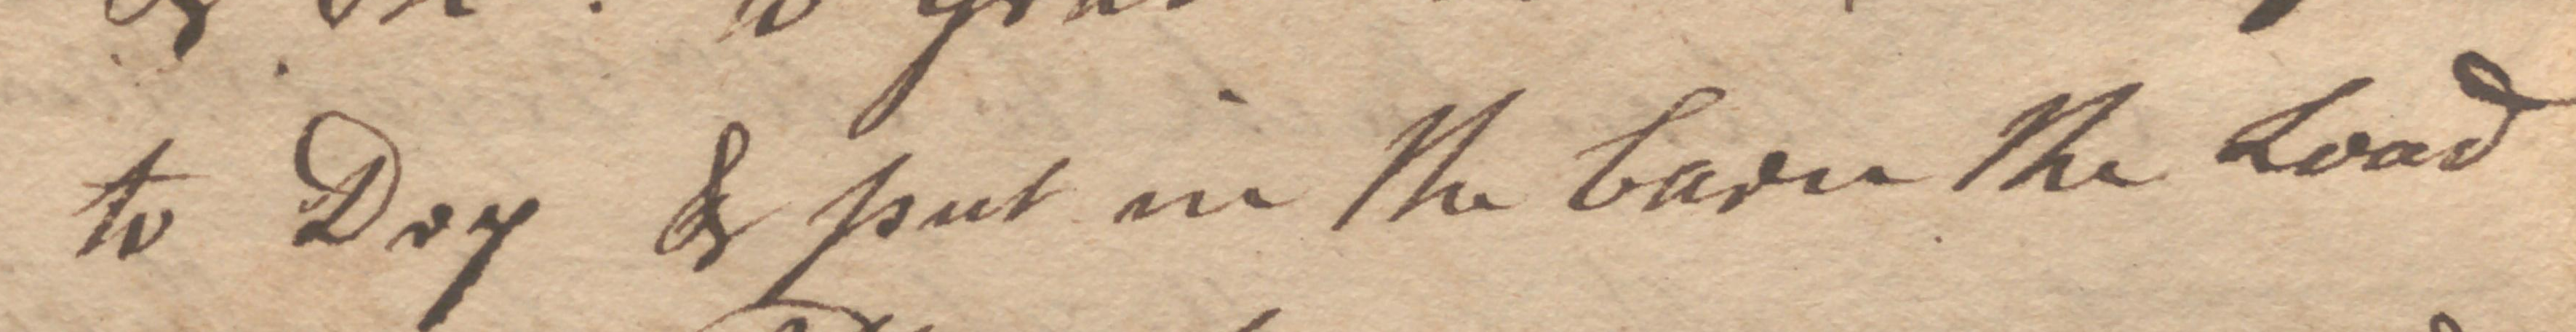to Doy & put in the barn the Load
